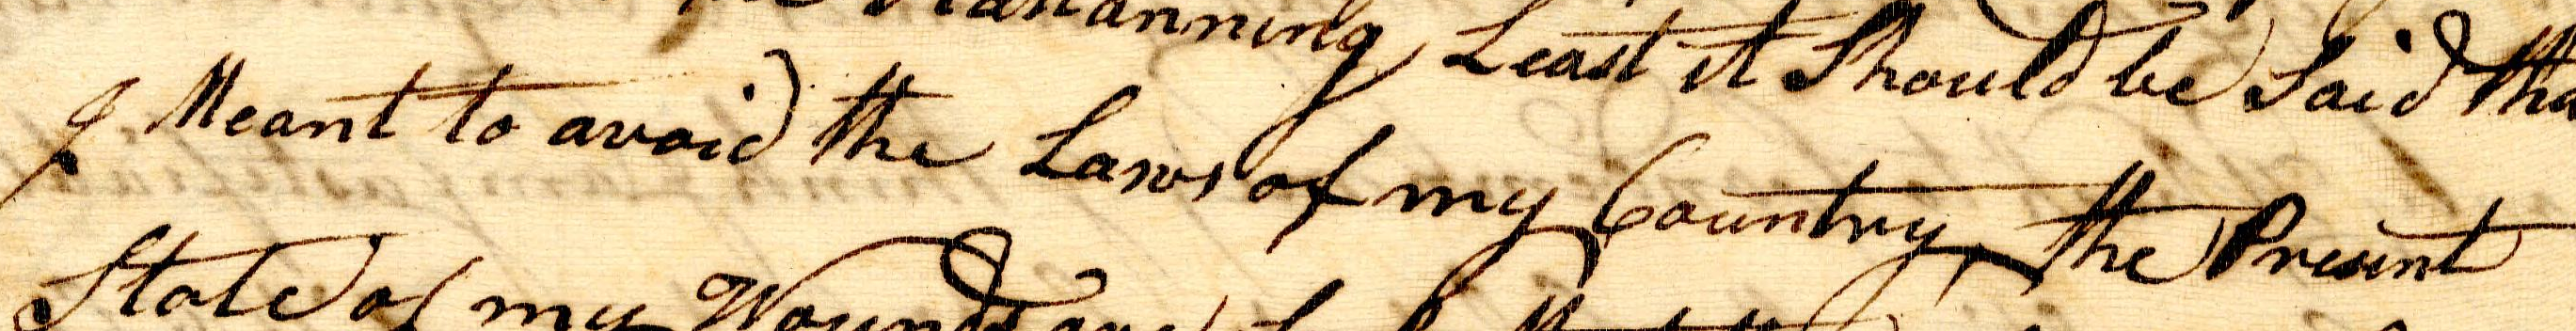I Meant to avoid the Laws of my Country, the Present
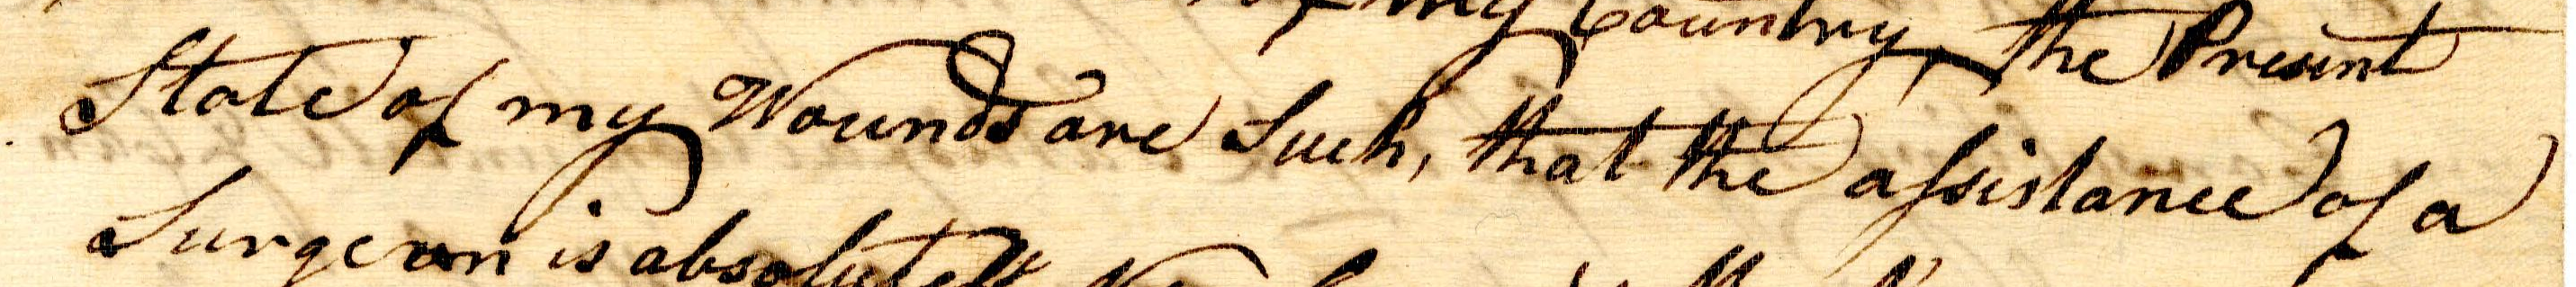State of my wounds are Such, that the assistance of a
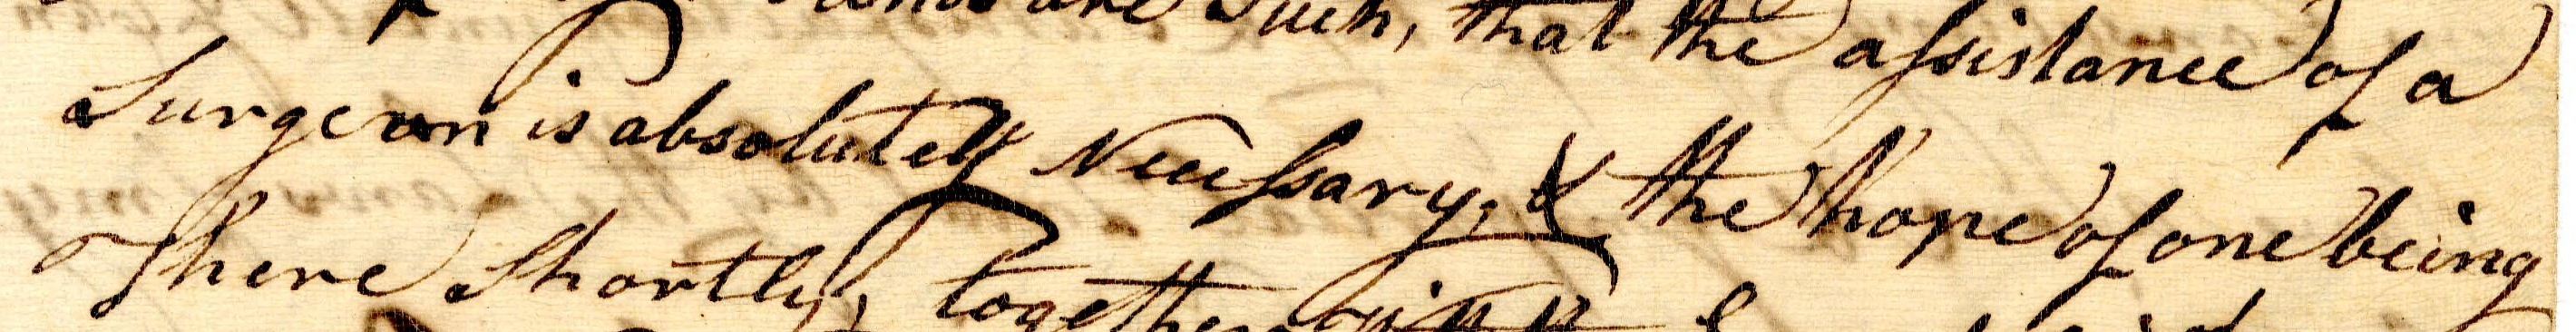Surgeon is absolutely Necessary & the Hope of one being
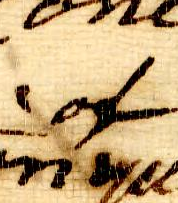of
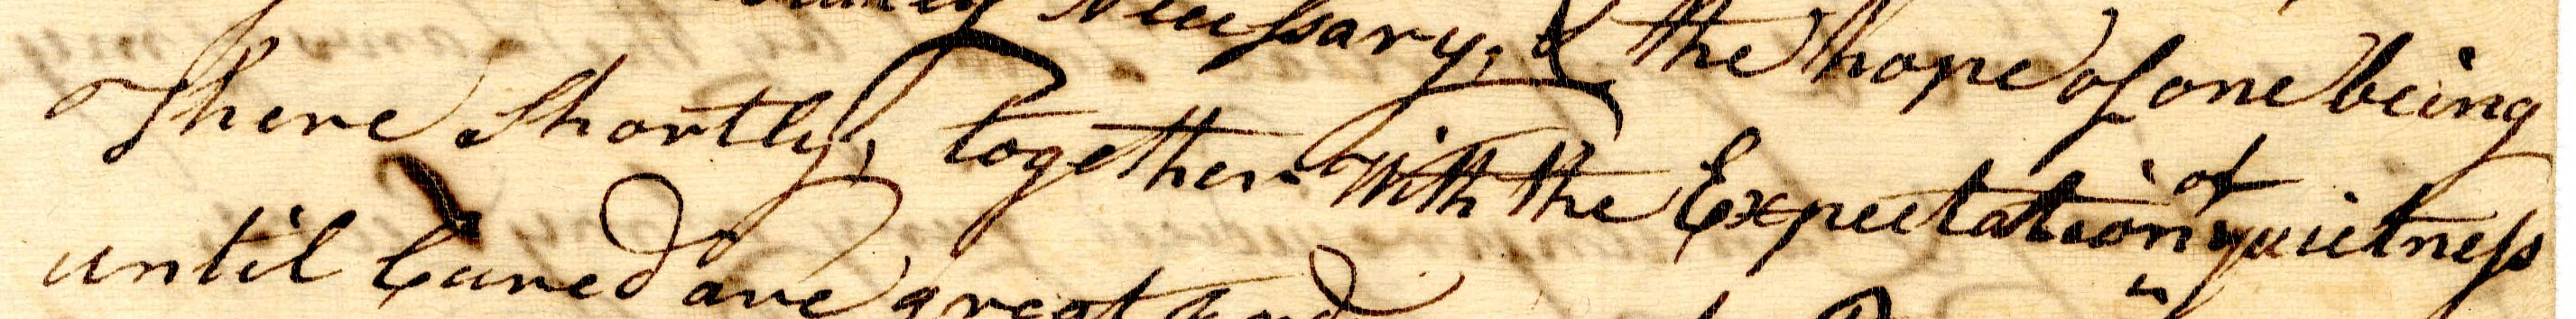There shortly together with the Expectation ^ quietness
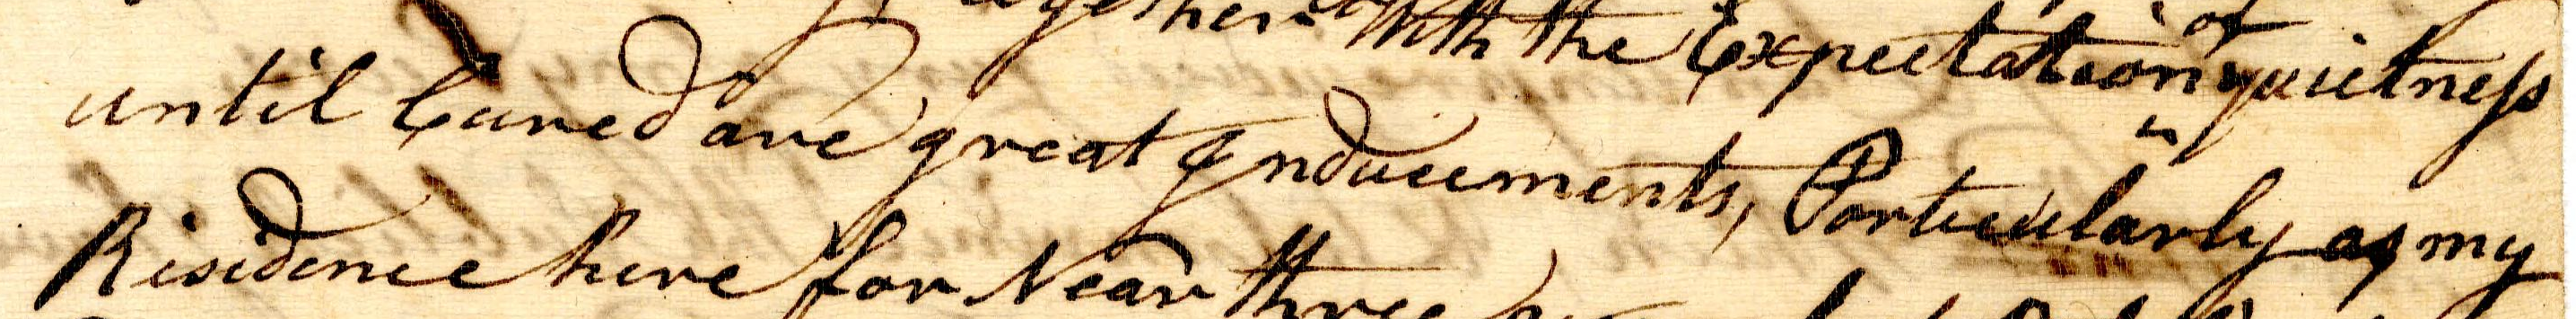until Cured are great Inducements, Particularly as my
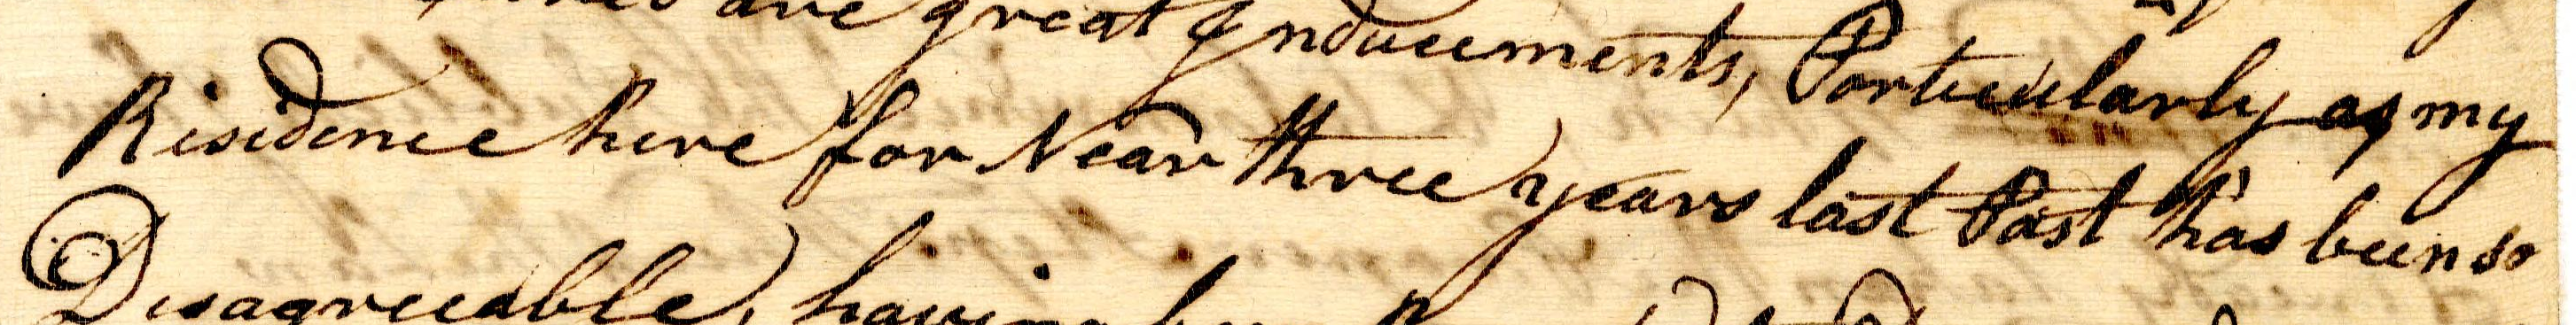Residence here for Near three years last Past has been so
